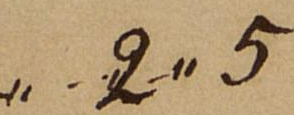.. 2 .. 5
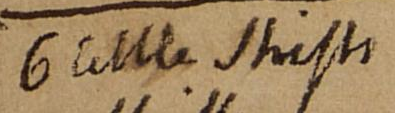6 little Shifts
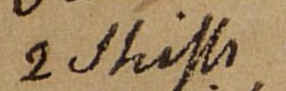2 Shifts
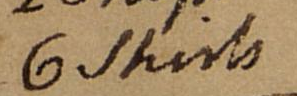6 Shirts
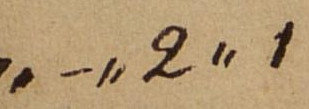- .. 2 .. 1
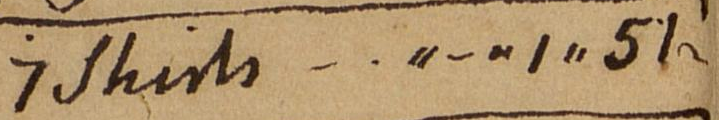7 Shirts -..-..1..5 1/2
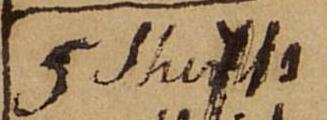5 Shifts
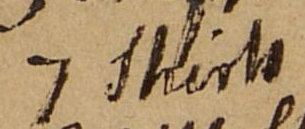7 Shirts
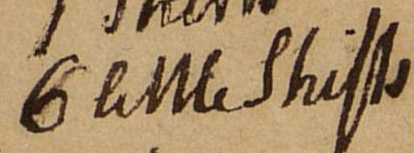6 little Shifts
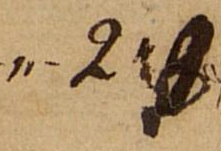.. - 2.. 8 1/2
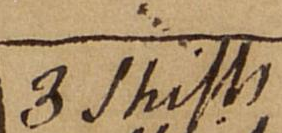3 Shifts
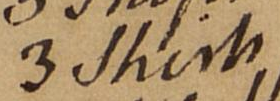3 Shirts
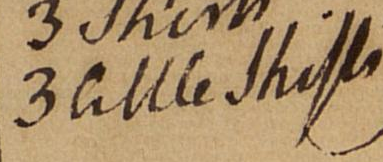3 little Shifts
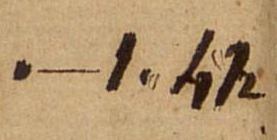.-1..4 1/2
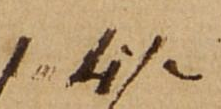1.. 4 1/2
